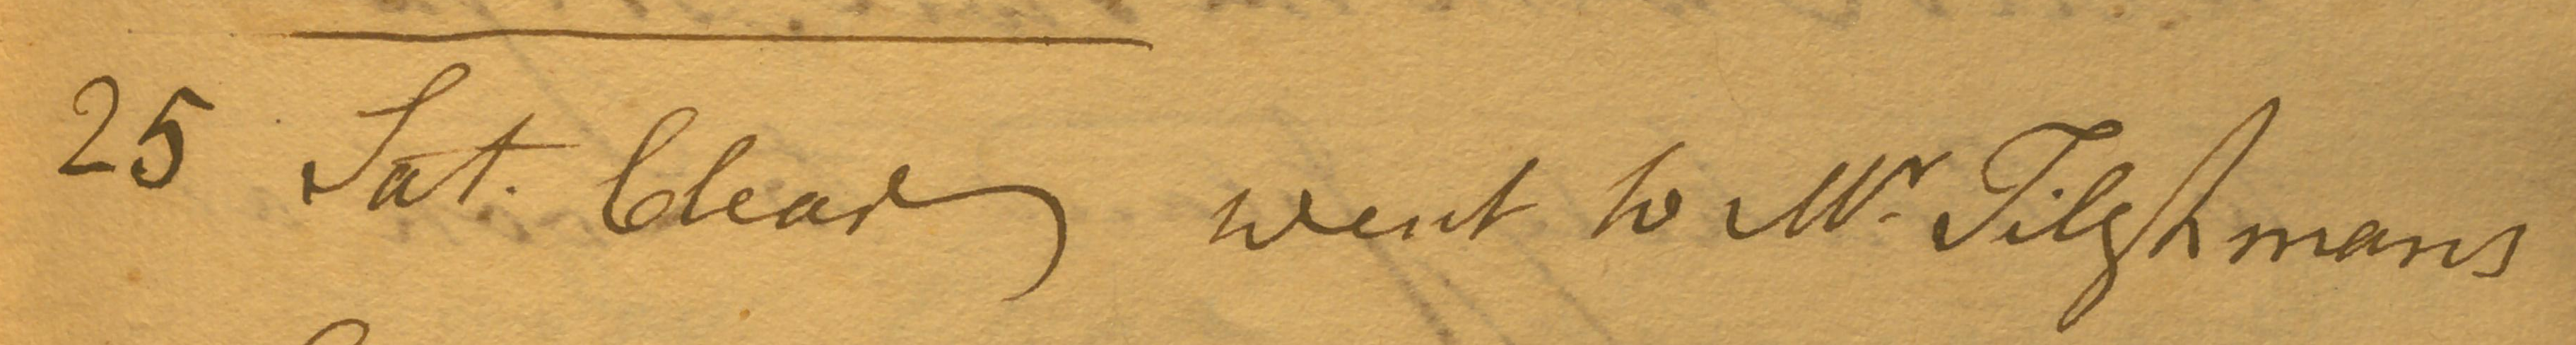25 Sat. Clear went to M^r. Tilghmans
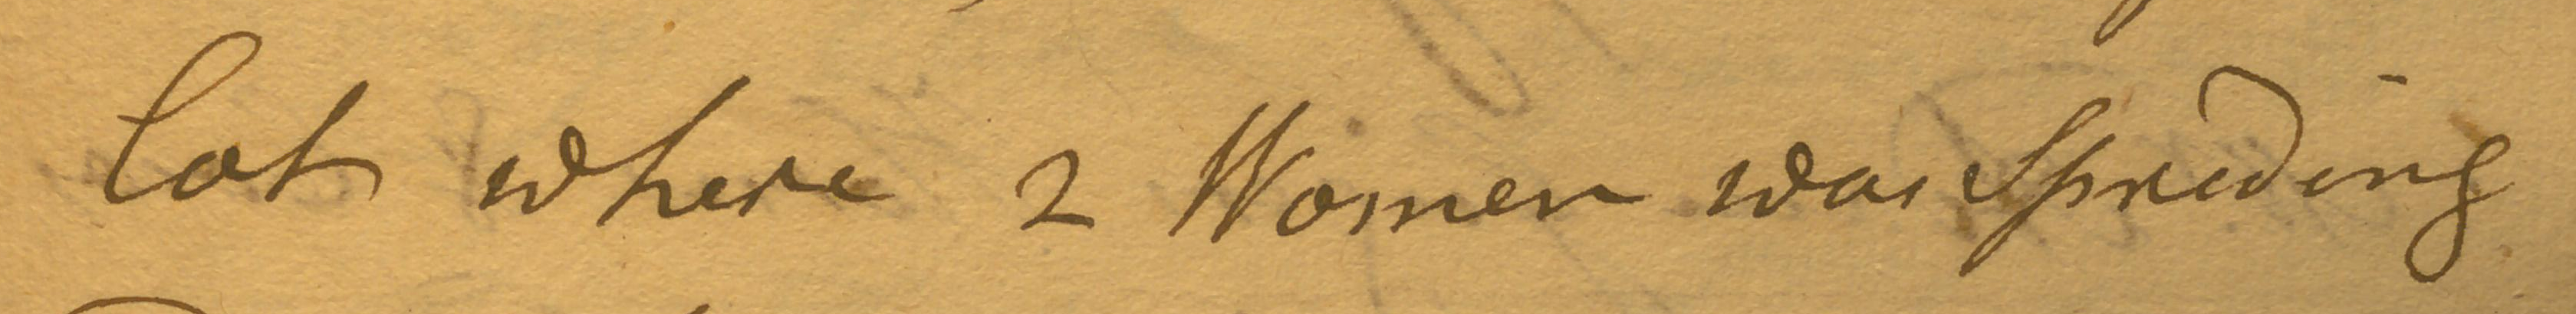lot where 2 Women was spreding
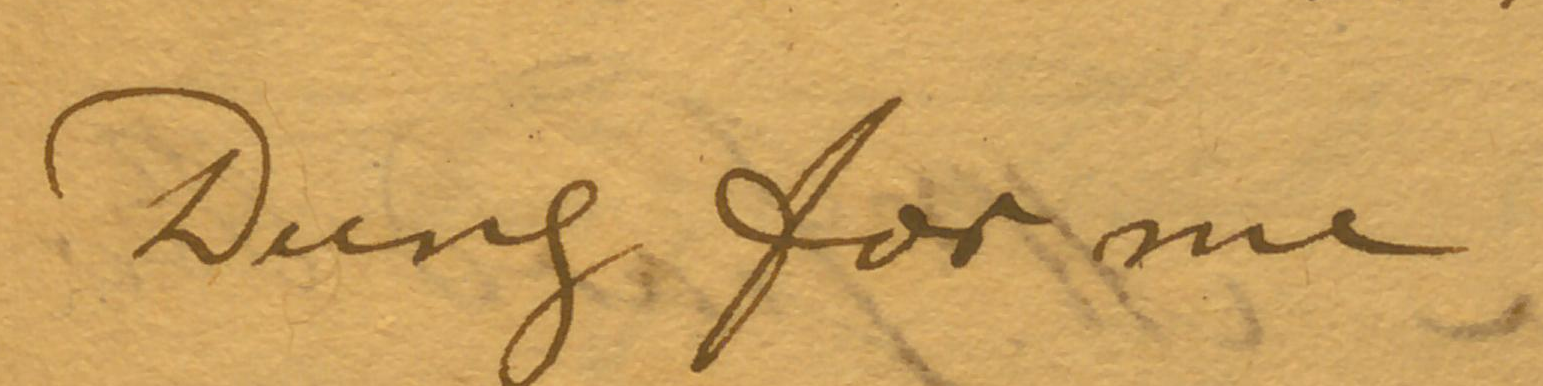Dung for me
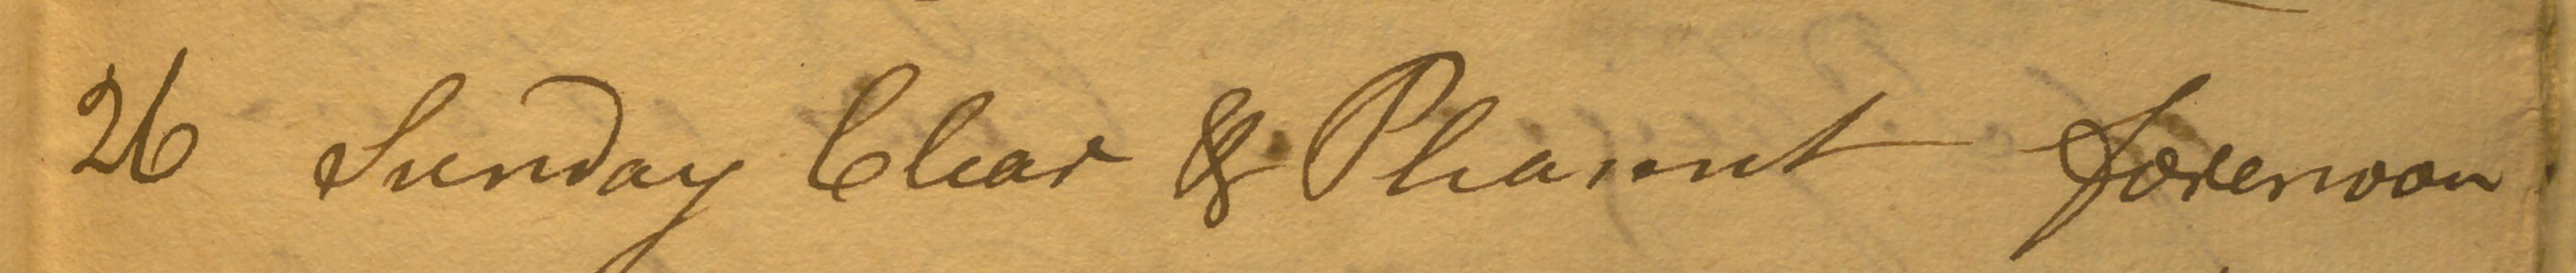26 Sunday Clear & Pleasent forenoon
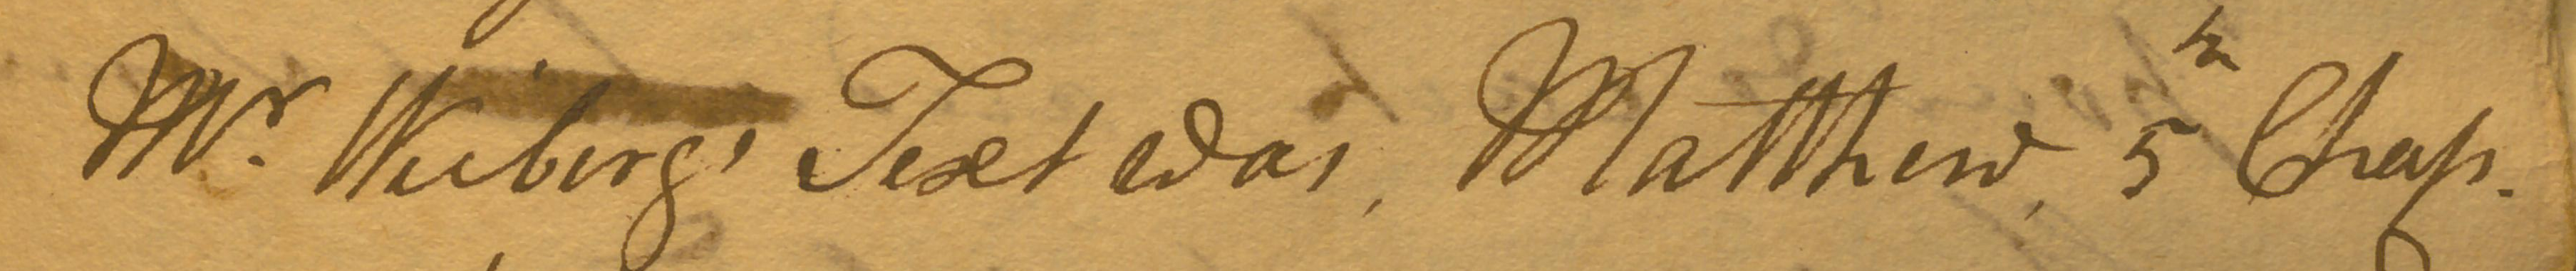M^r. Weibergs Text was Matthew 5^th Chap
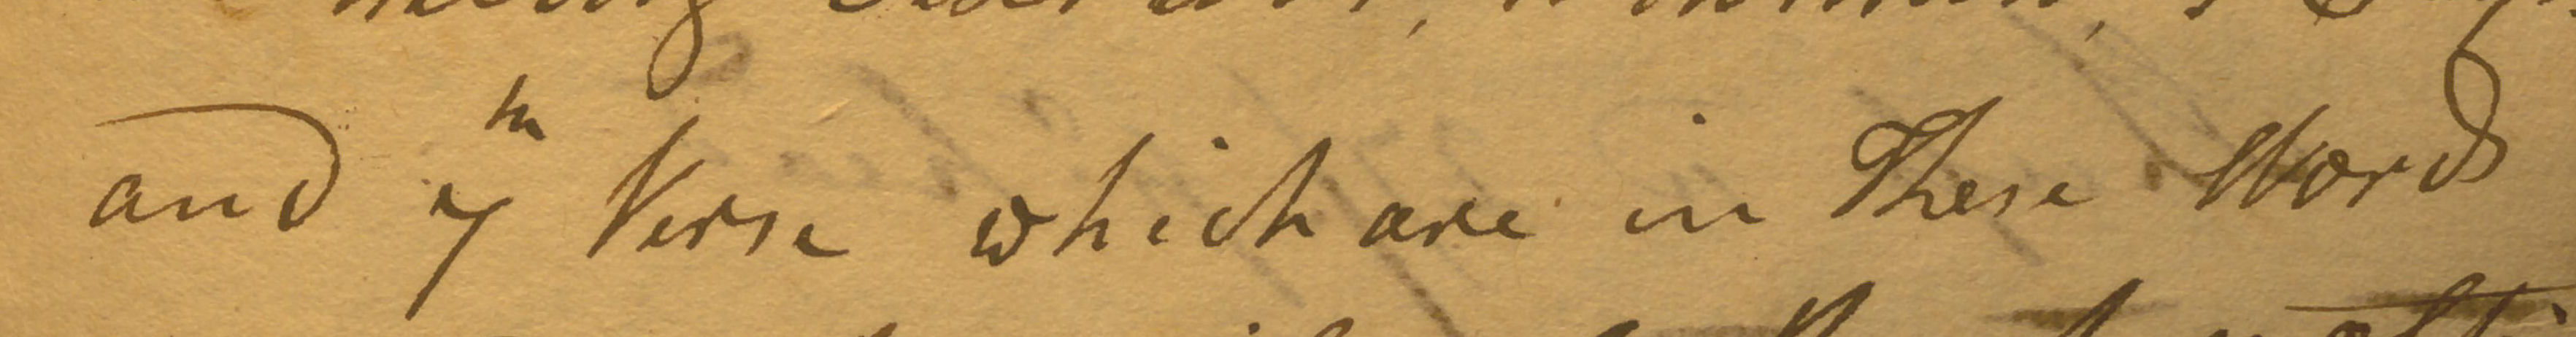and 7^th Verse which are in These Words
